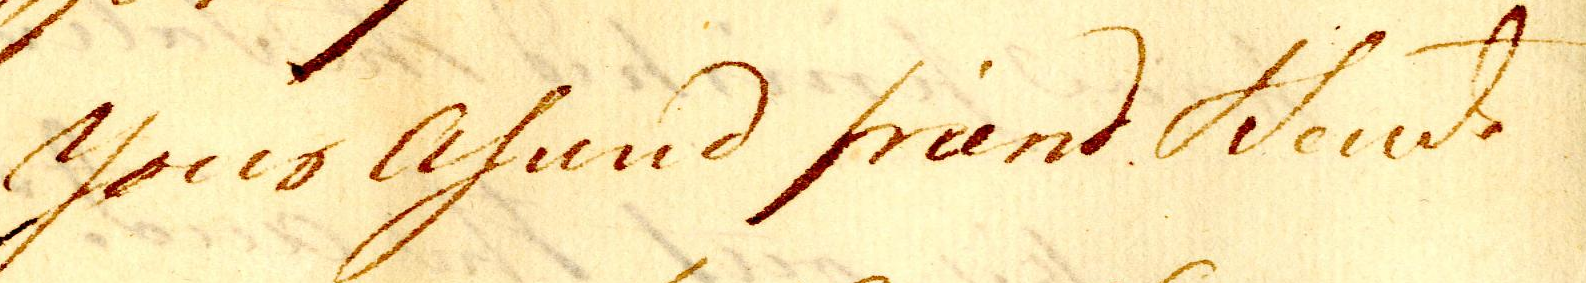You'r assured friend & Serv^t.
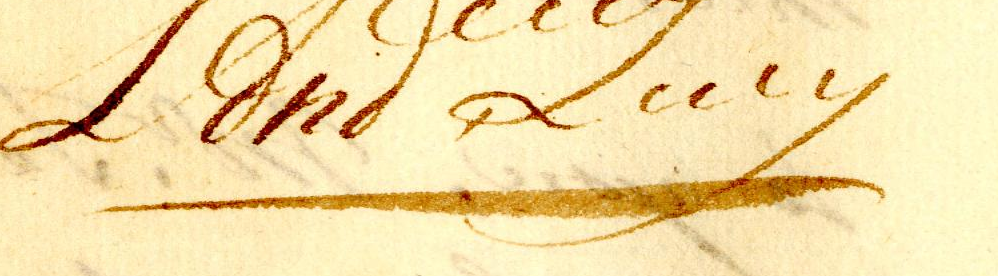And^rew Levy
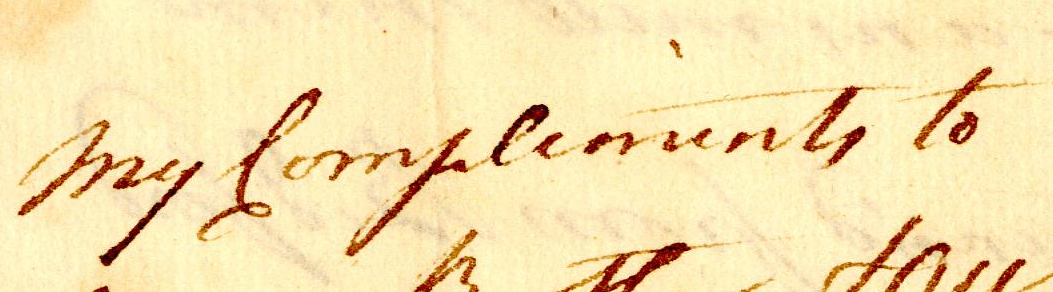my Compliments to
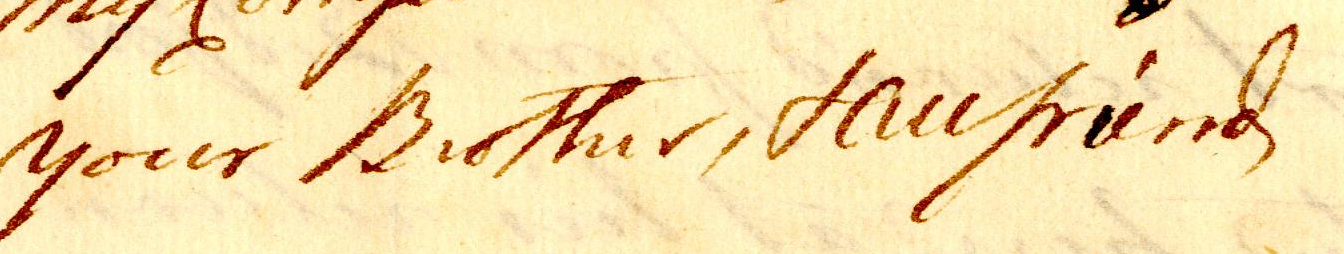your Brother, & ou friend
